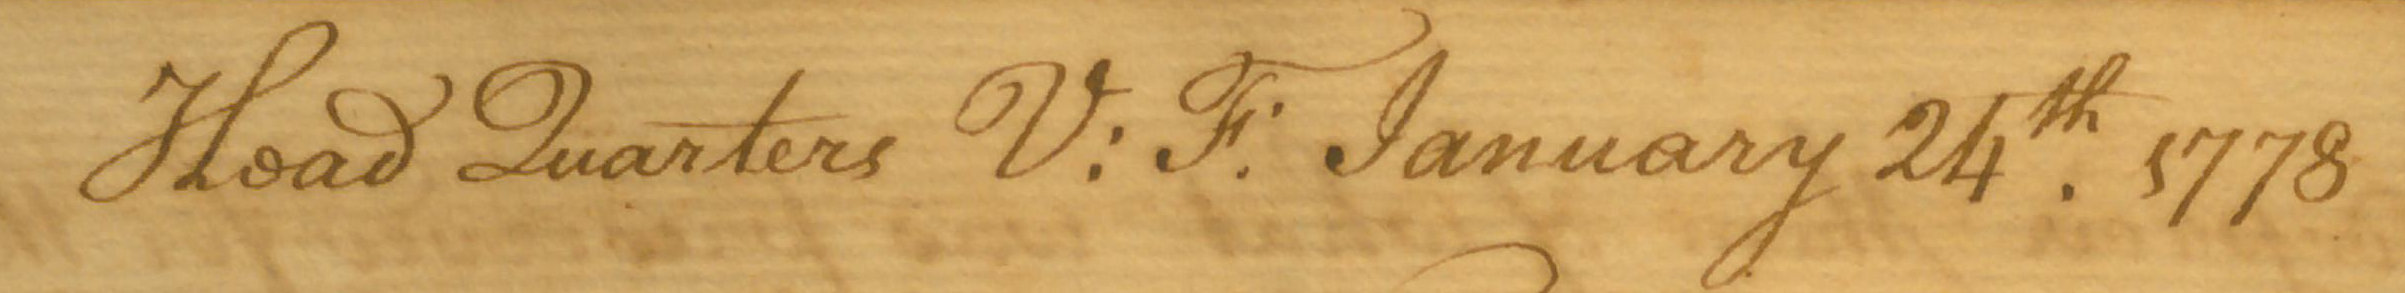Head Quarters V: F: January 24^th. 1778
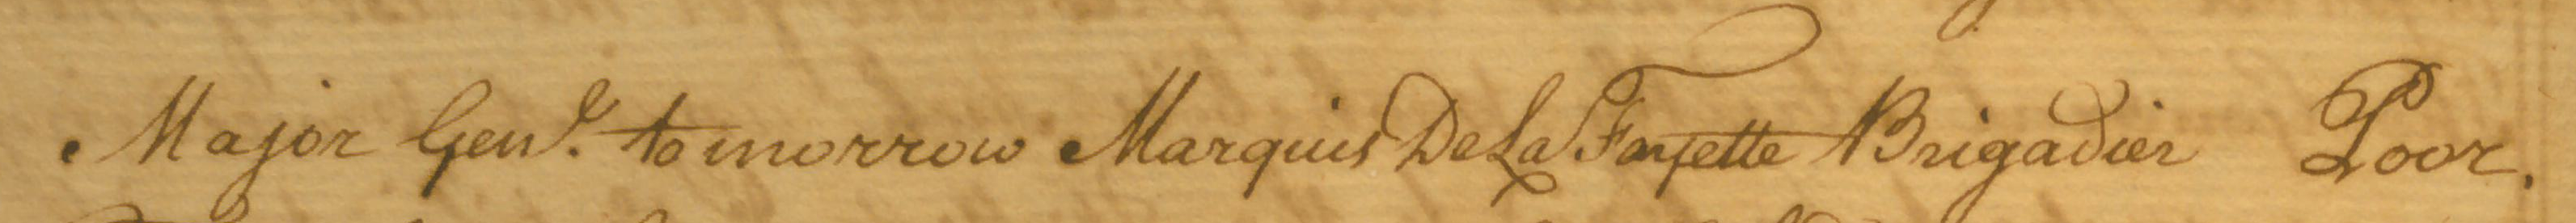Major Gen^l. tomorrow Marquis De La Fayette Brigadier Poor.
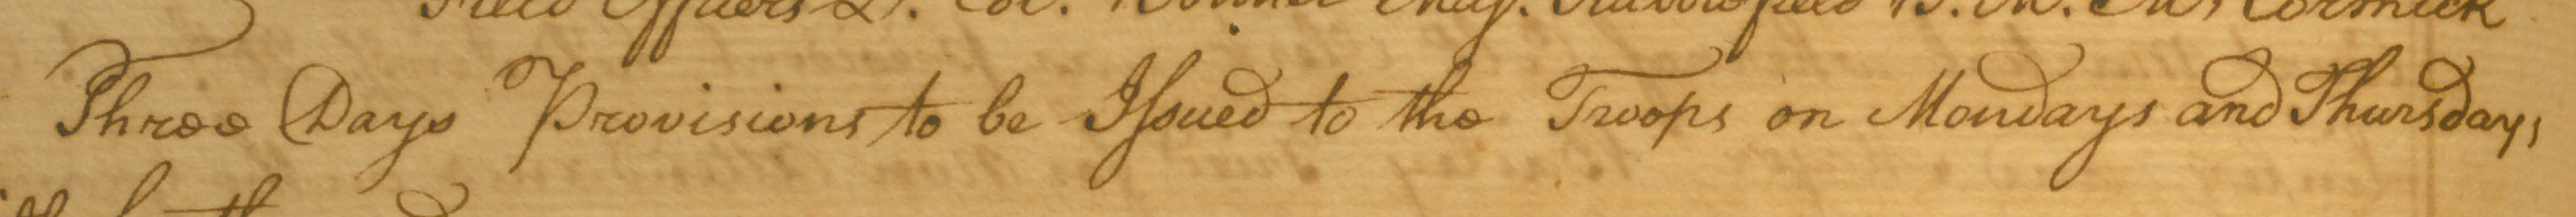Three Days Provisions to be Issued to the Troops on Mondays and Thursdays
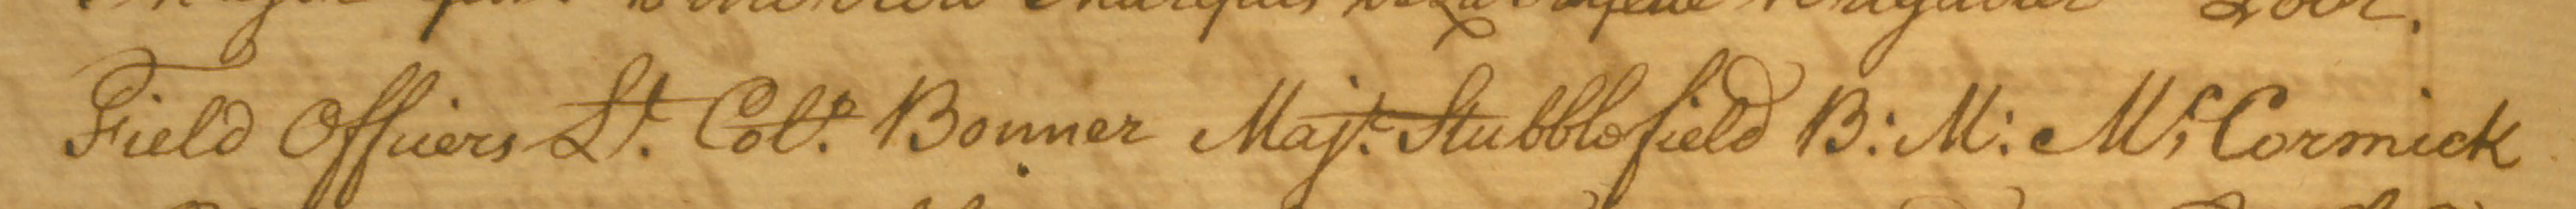Field Officers Lt. Col^o. Bonner Maj^r. Stubblefield B: M: M^cCormick
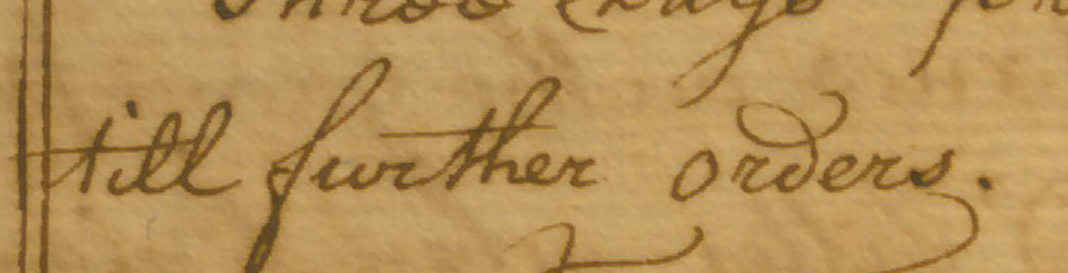till further orders.
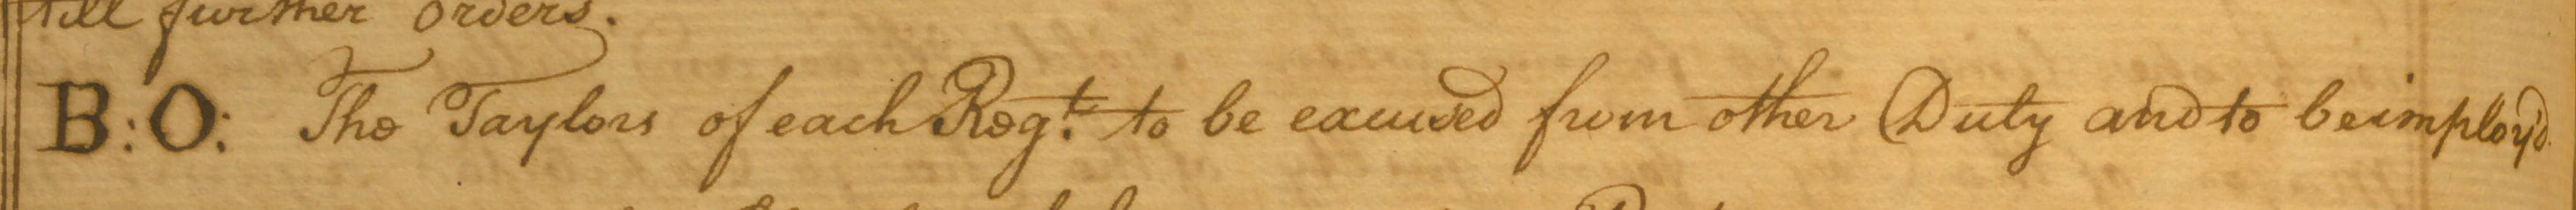B: O: The Taylors of each Reg^t. to be excused from other Duty and to be imploy'd
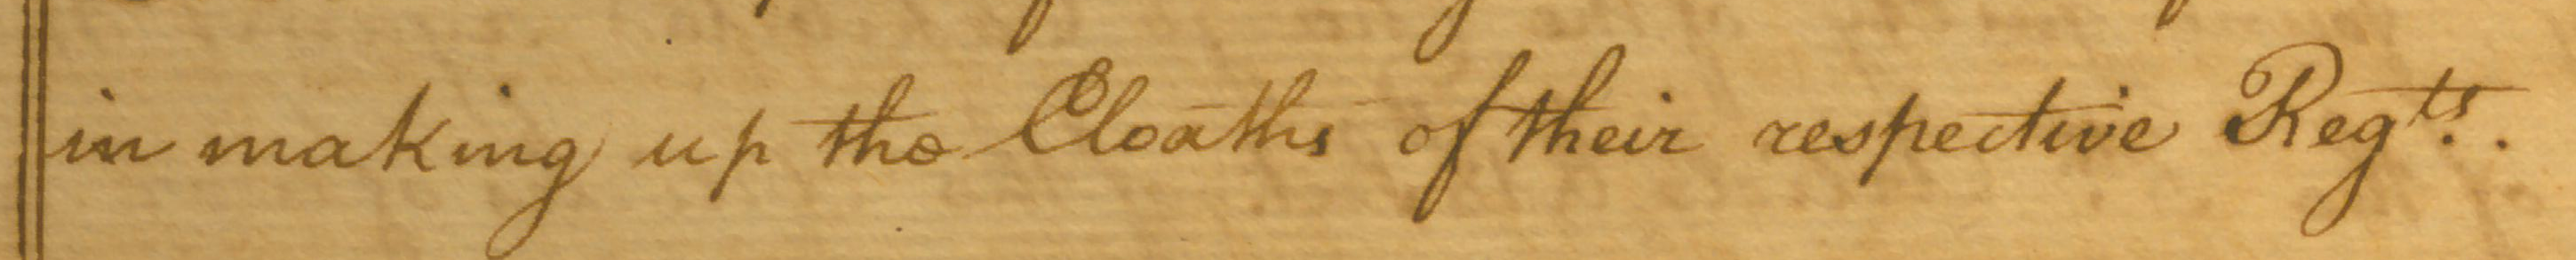in making up the Cloaths of their respective Reg^ts.
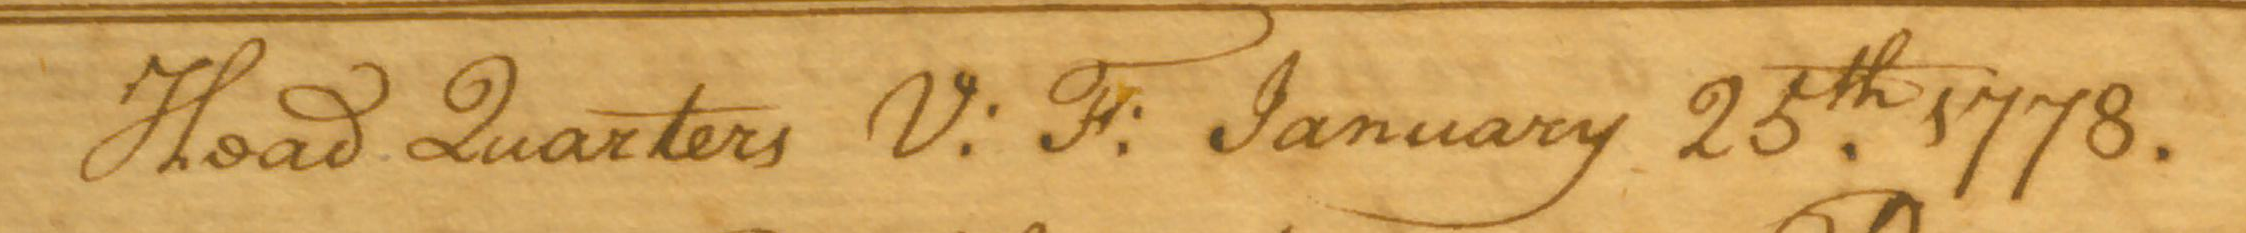Head Quarters V: F: January 25^th. 1778.
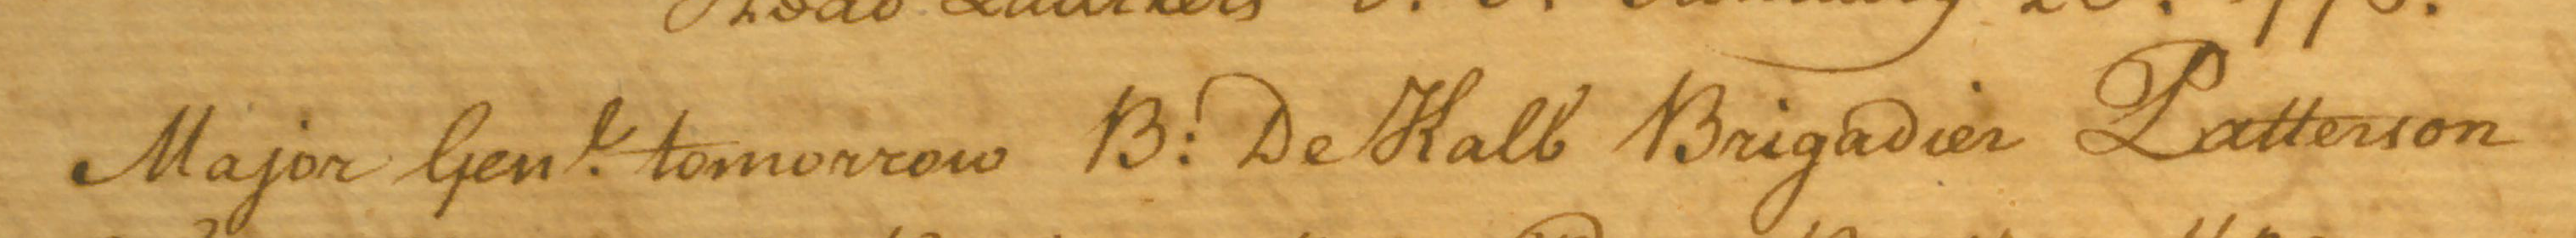Major Gen^l. tomorrow B: DeKalb Brigadier Patterson
